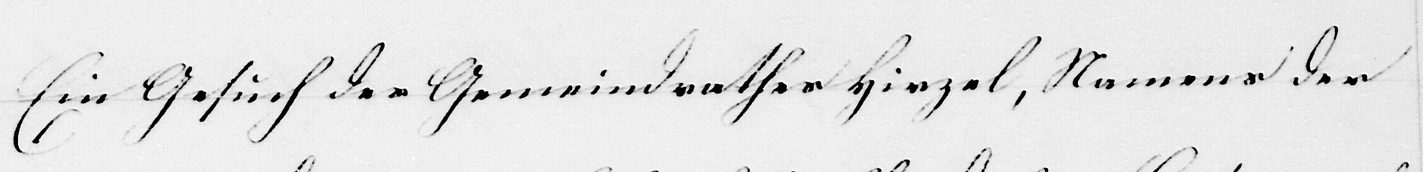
Ein Gesuch des Gemeindrathes Hirzel, Namens der
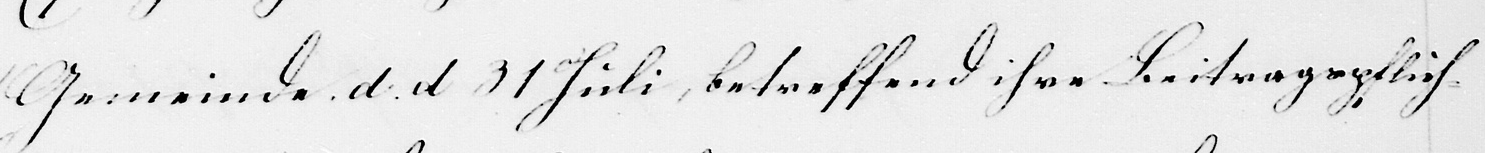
Gemeinde d. d 31 Juli, betreffend ihre Beitragspflich¬
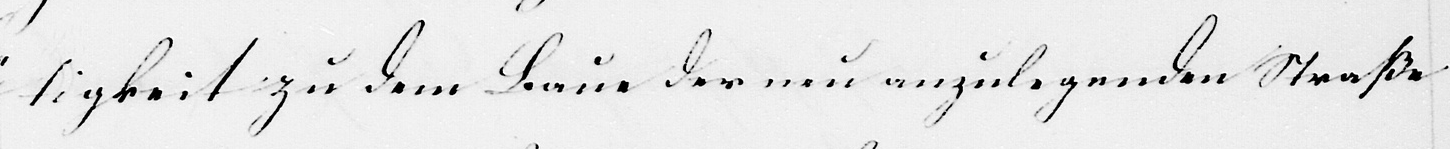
tigkeit zu dem Baue der neu anzulegenden Straße
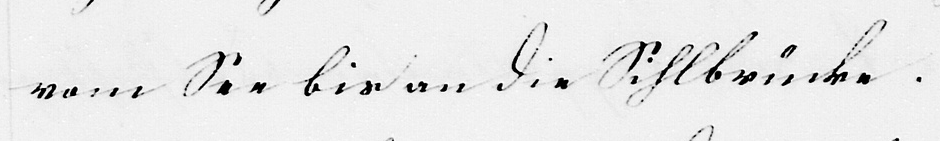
vom See bis an die Sihlbrücke.
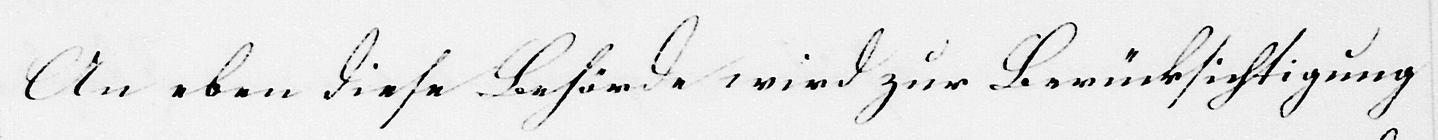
An eben diese Behörde wird zur Berücksichtigung
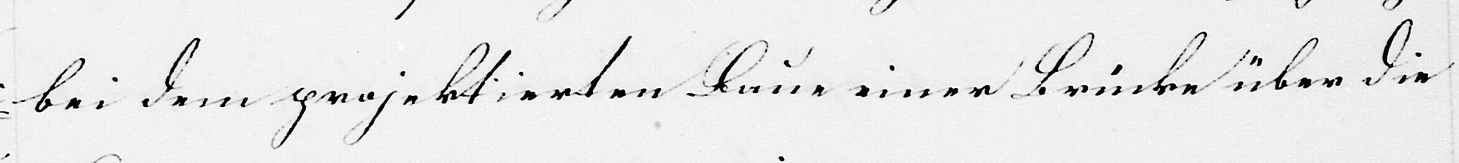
bei dem projektierten Baue einer Brücke über die
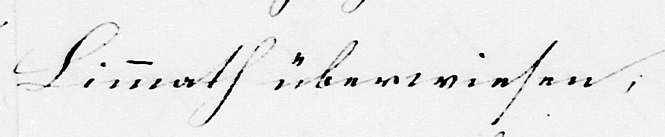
Limmath überwiesen,
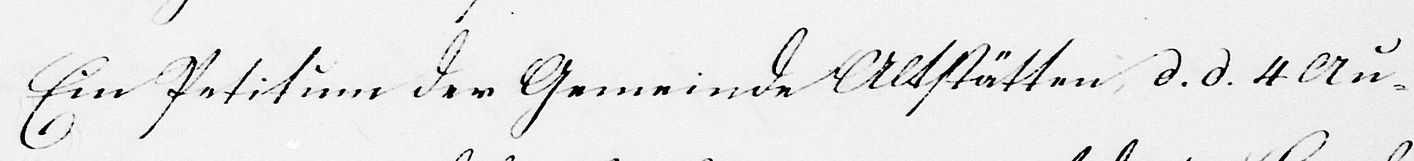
Ein Petitum der Gemeinde Altsätten d. d. 4 Au¬
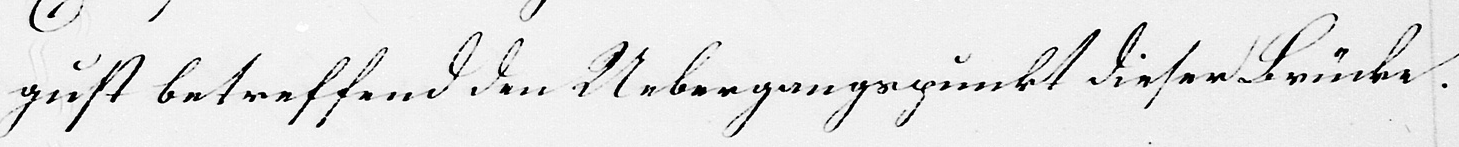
gust betreffend den Uebergangspunkt dieser Brücke.
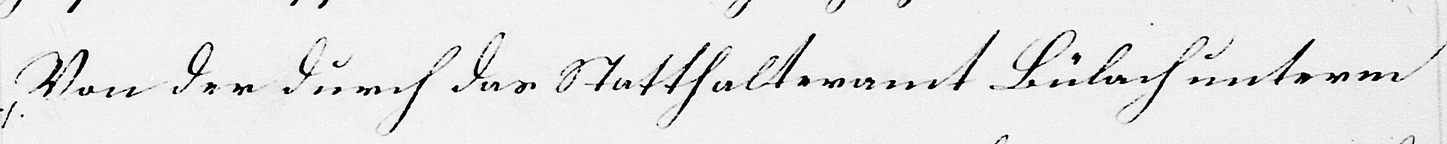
Von der durch das Statthalteramt Bülach unterm
